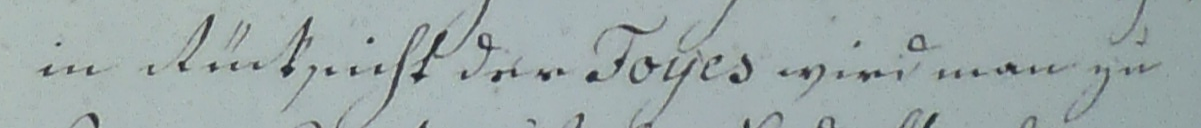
in Rücksicht der Foyes wird man zu
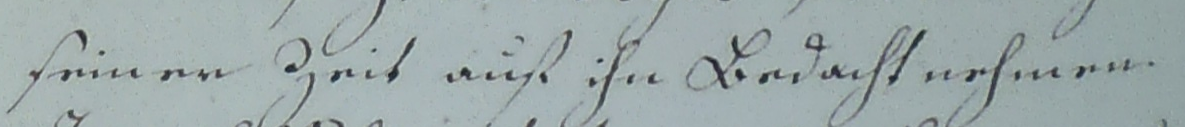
seiner Zeit auf ihn Bedacht nehmen.
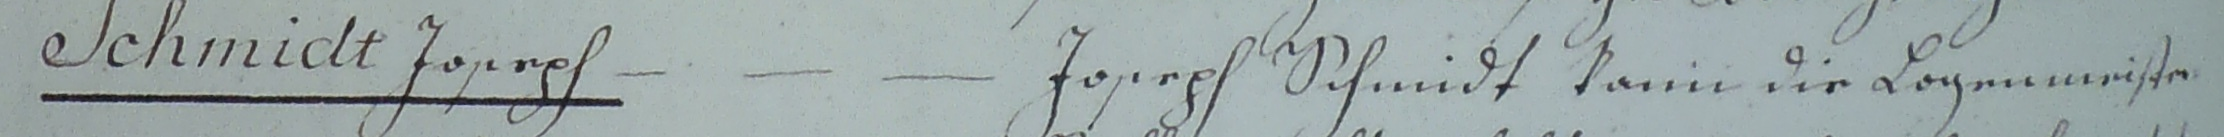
Schmidt Joseph _ _ _ Joseph Schmidt kann die Logenmeister
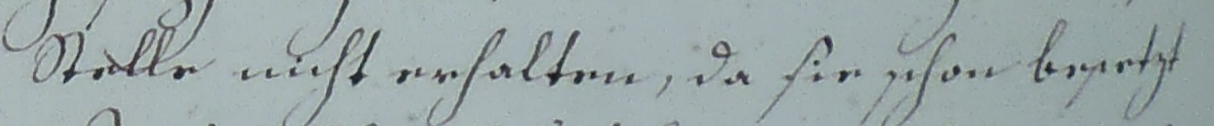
Stelle nicht erhalten, da sie schon besetzt
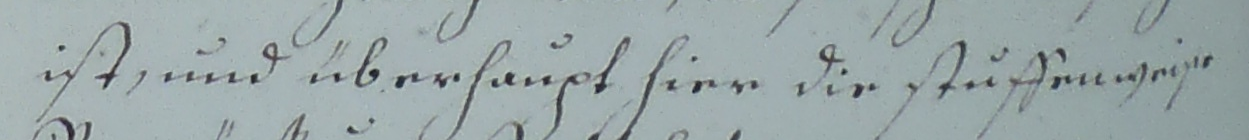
ist, und überhaupt hier die stuffenweise
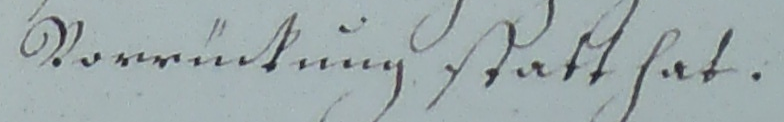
Vorrückung statt hat.
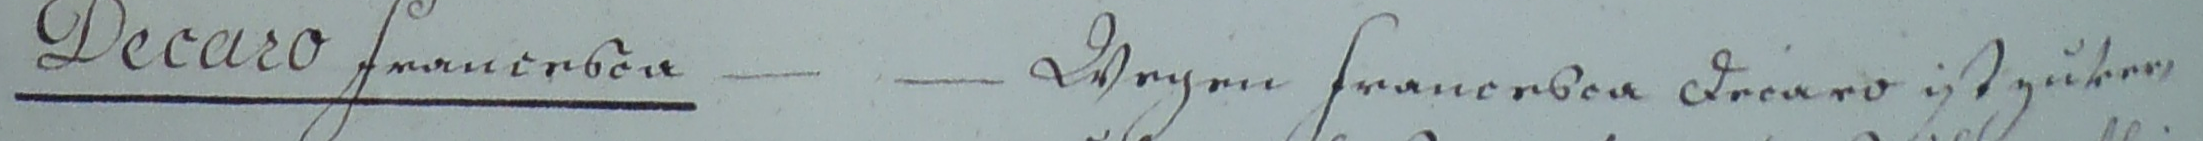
Decaro Francesca _ _ Wegen Francesca Decaro ist zuver¬
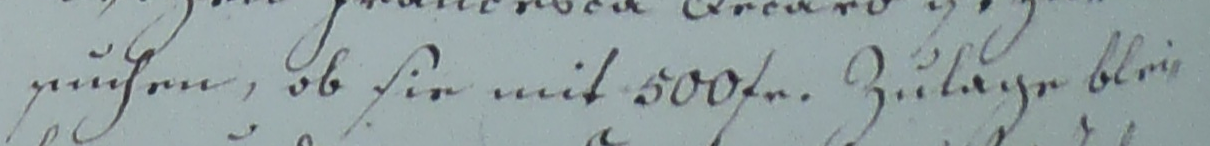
suchen, ob sie mit 500fr. Zulage blei¬
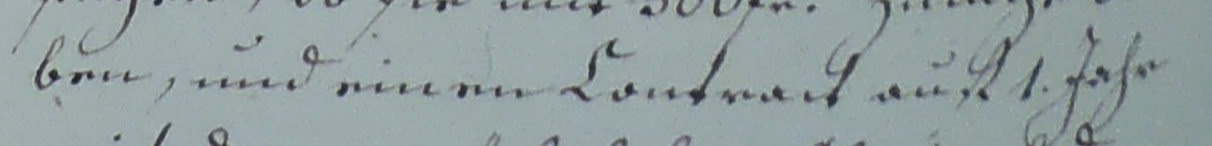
ben, und einen Contract auf 1. Jahr
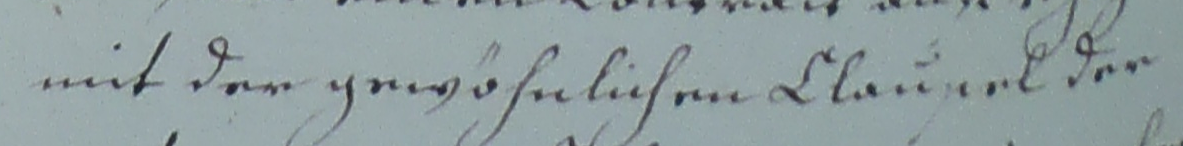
mit der gewöhnlichen Clausel der
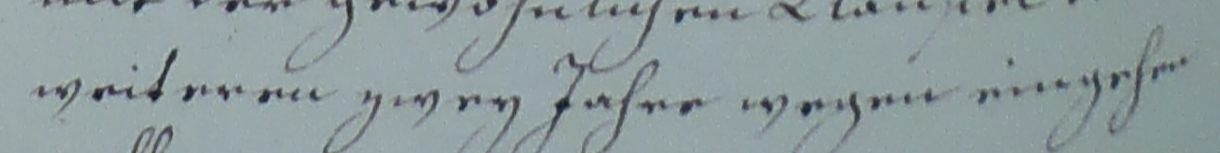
weiteren zwey Jahre wegen eingehen
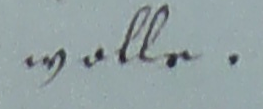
wolle.
